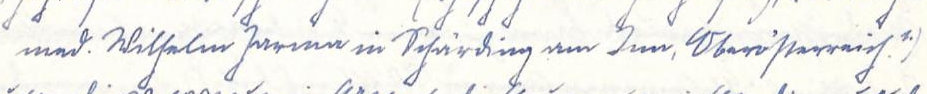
med. Wilhelm Jarna in Schärding am Inn Oberösterreich 1)
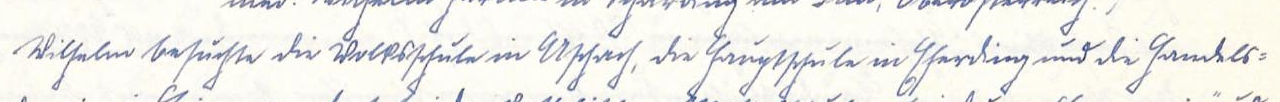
ilselm besuchte die Volkschule in Aschach, die Haupttschule in Eferding und die Handels-
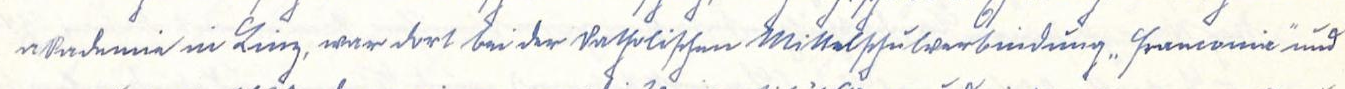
akademie in Linz, war dort bei der katholischen Mittelschulverbindung "Franconia" und
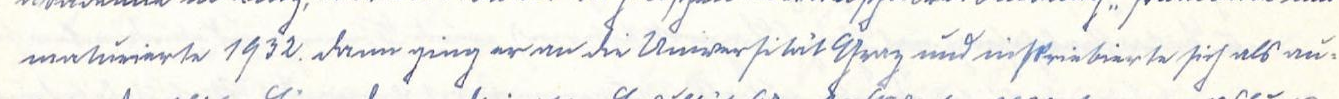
maturierte 1932. Dann ging er an die Universithät Graz und inskriebierte sich als au-
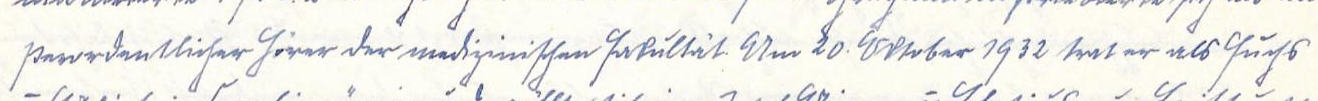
ßerordentlicher Hörer der medizinischen Fakulät. Am 20. Oktober 1932 trat er als Fuchs
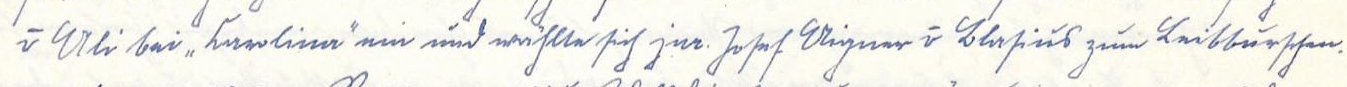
v/o Ali bei „Carolina" ein und wahlte sich jur. Josef Aigner v/o Blasius zum Leibburschen.
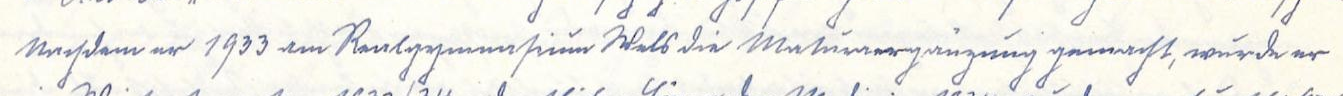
Nachdem er 1933 am Realgymnasium Wels die Maturaergänzung gemacht, wurde er
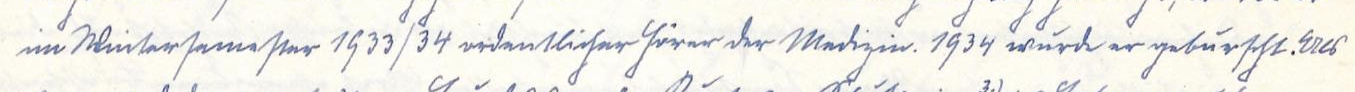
im Wintersemester 1933/34 ordentlicher Hörer der Medizin. 1934 wurde er geburscht. Als
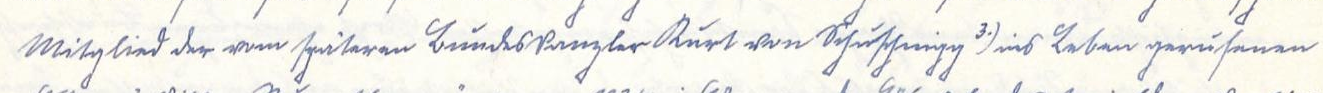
Mitglied der vom späteren Bundeskanzler Kurt von Schuschnigg 2) ins Leben gerufenen
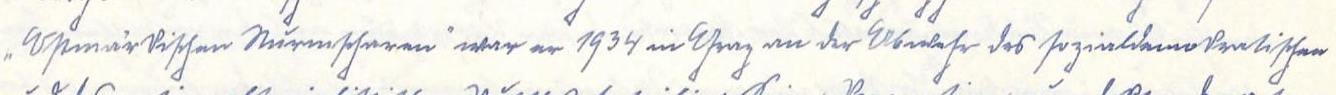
„Ostmärkischen Sturmscharen“ war er 1934 in Graz an der Abwehr des sozialdemokratischen
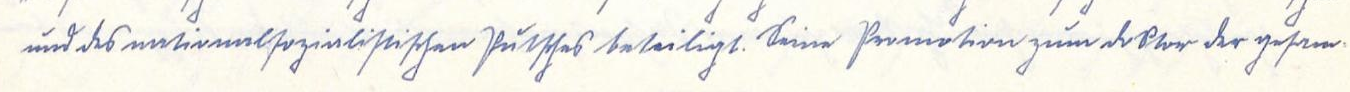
und des nationalsozialistischen Putsches beteiligt. Seine Promotion zum Doktor der gesam
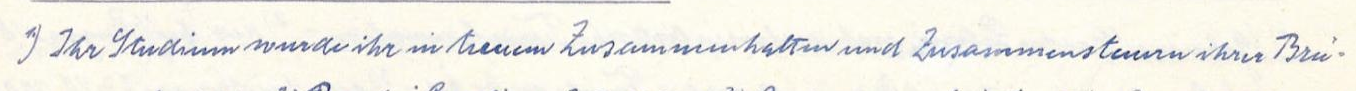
1.) Ihr Studium wurde ihr in trauem Zusammemhalten und Zusammensteurn ihrer Brü-
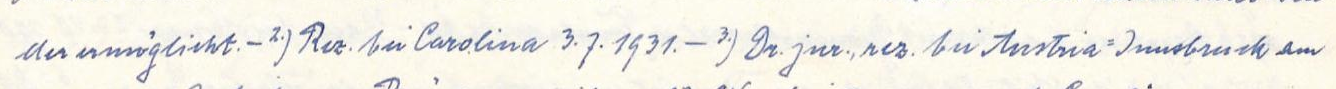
der ermöglicht.– 2) Rez. bei Carolina 3.7.1931. 3) Dr. jur.rez. bei Austria Innsbruck am
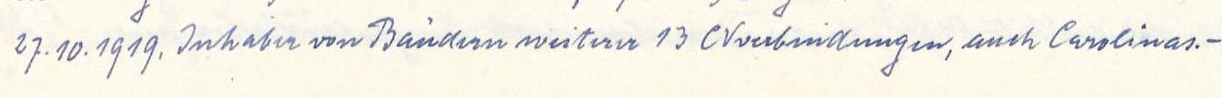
27.10.1919, Inhaber von Bändern weiterer 13 CVverbindungen, auch Carolinas.-
